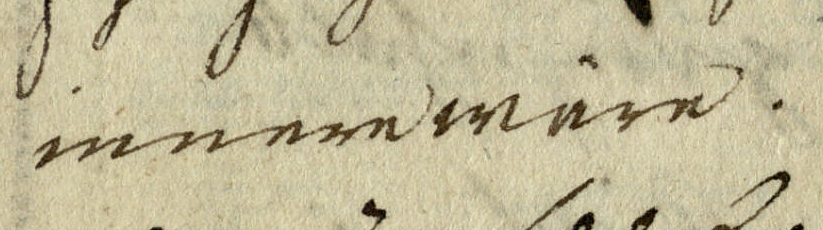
innern wäre.
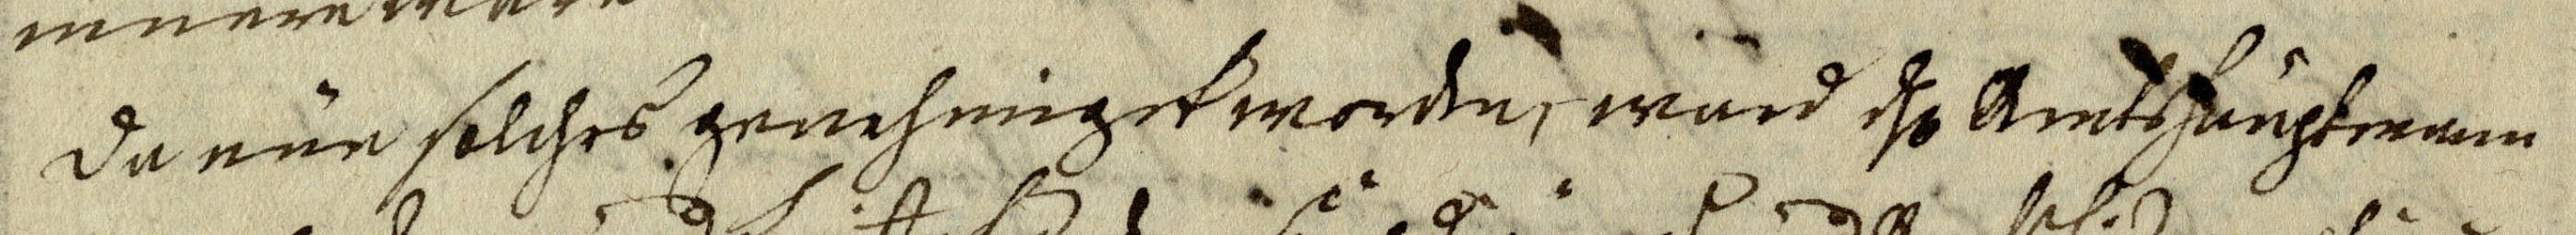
da nun solches genehmiget worden, wird dh. Amtshauptmann
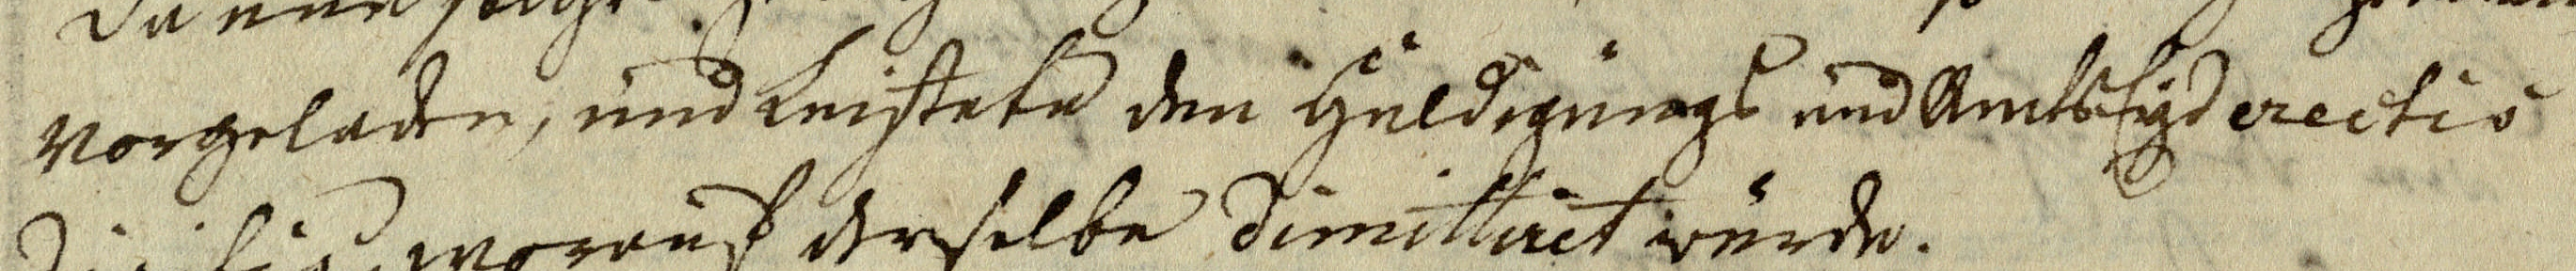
vorgeladen, und leistete den Huldigungs und AmtsEÿd erectis
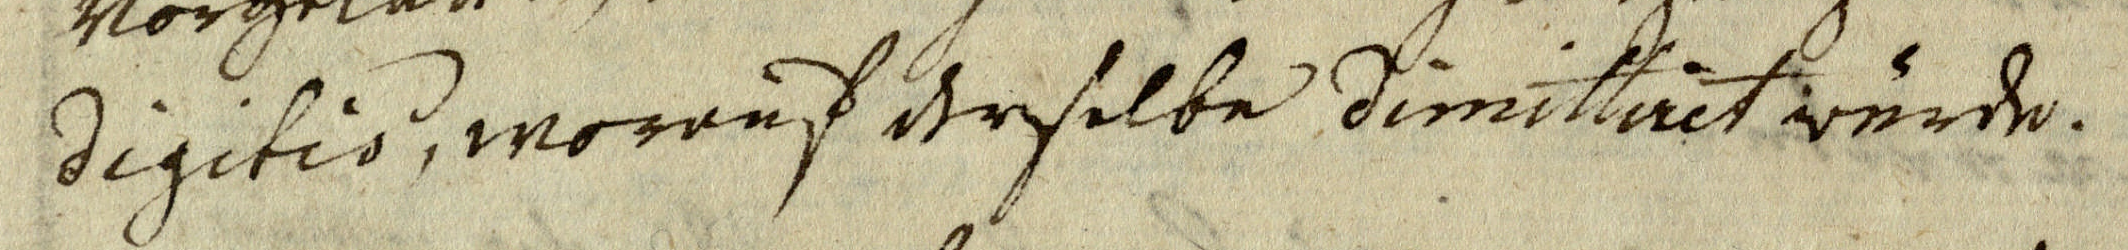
digitis, worauf derselbe dimittiret wurde.
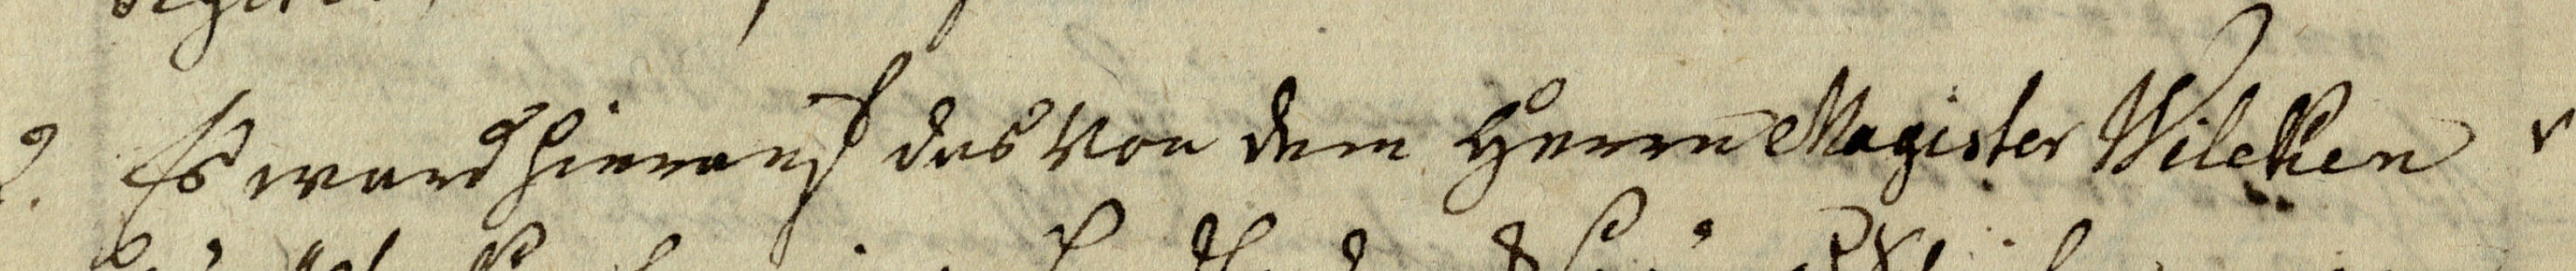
2. Es ward hierauf das von dem Herrn Magister Wilcken
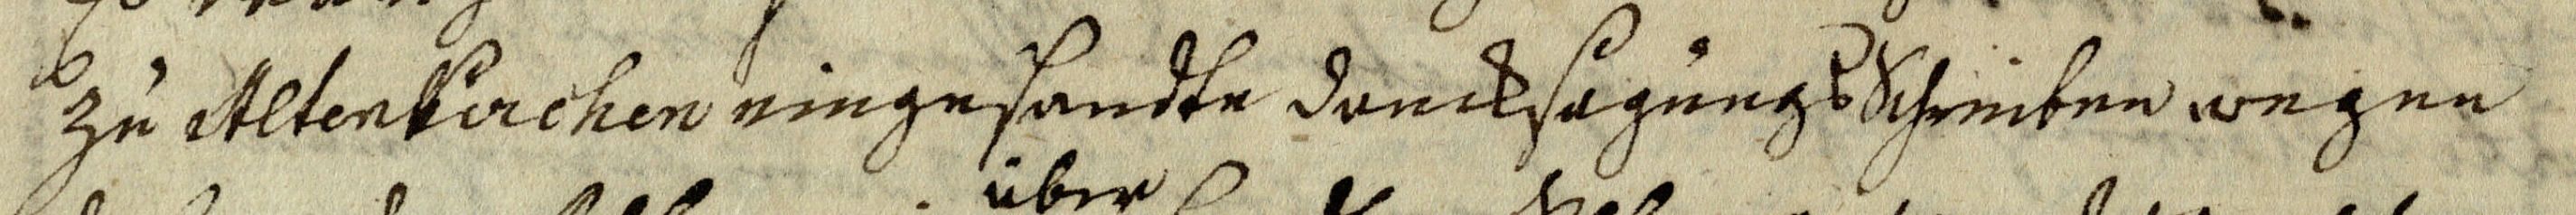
zu Altenkirchen eingesandte DancksagungsSchreiben wegen
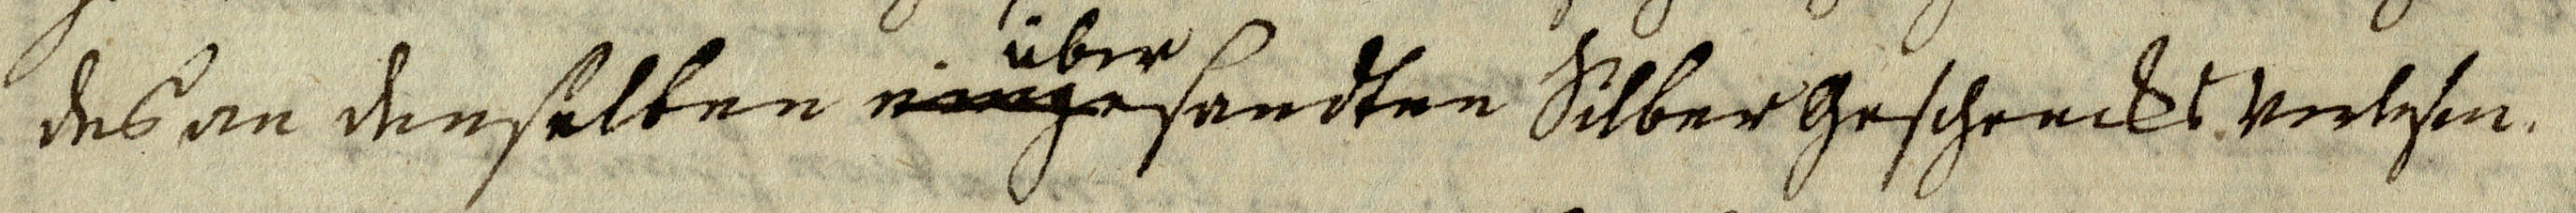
des an denselben übersandten Silbergeschencks verlesen.
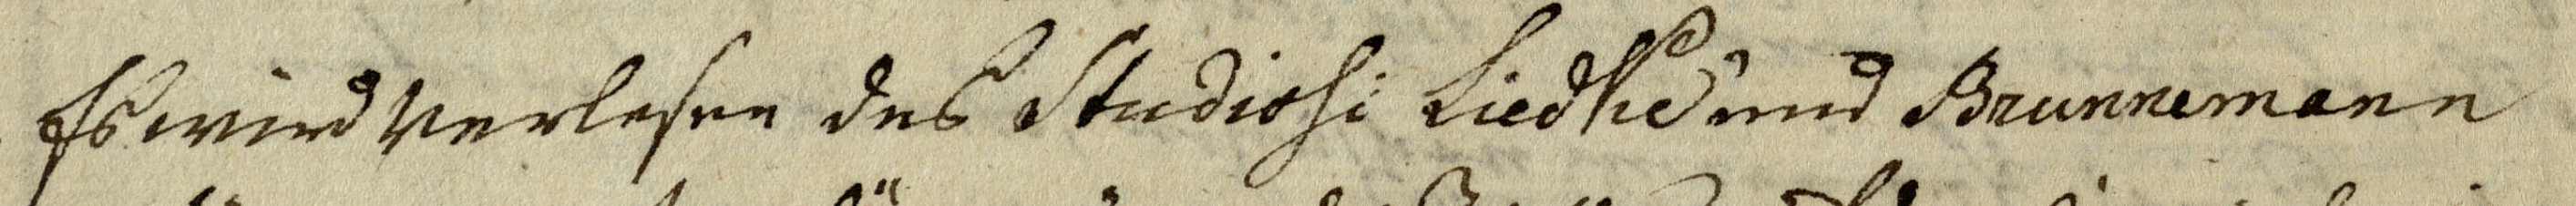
3. Es wird verlesen des Studiosi Liedke und Baumann
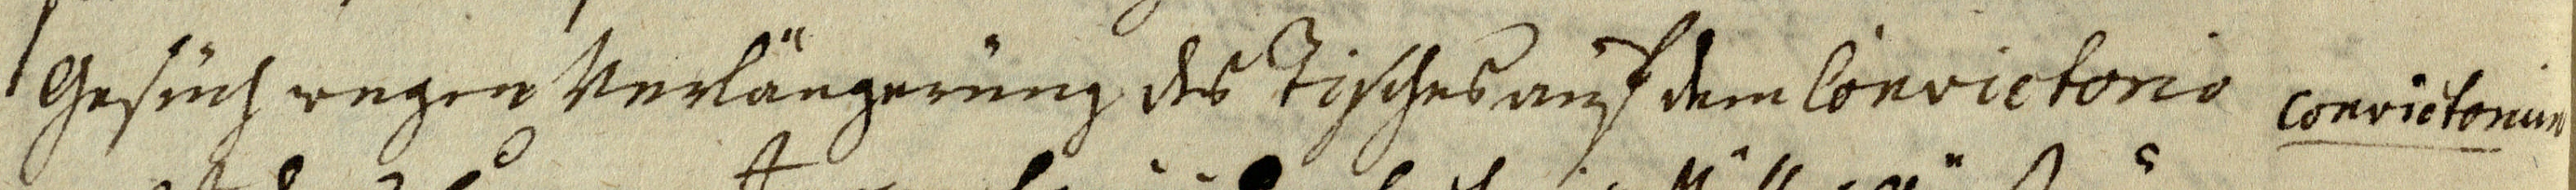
Gesuch wegen Verlängerung des Tisches auf dem Convictorio
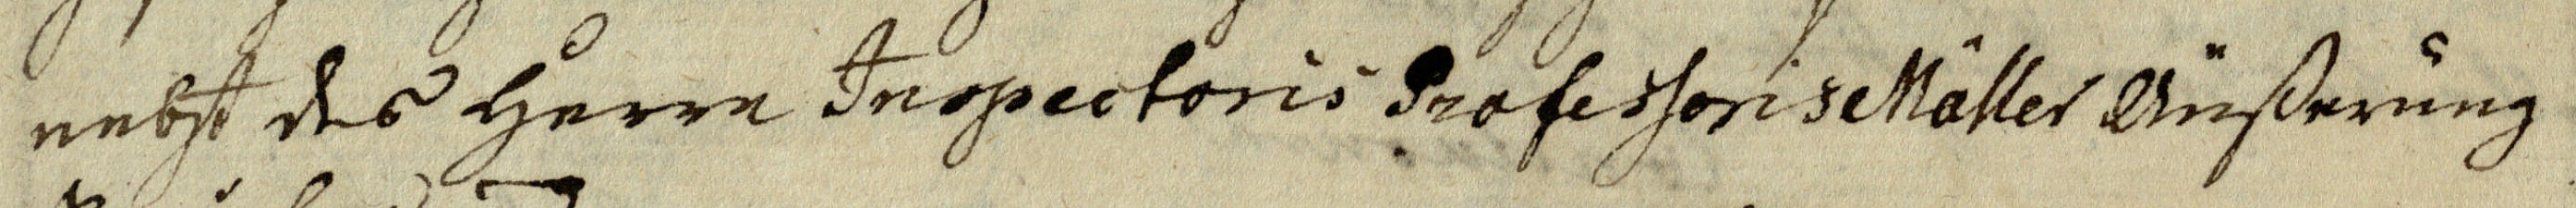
nebst des Herrn Inspectoris Professoris Möller Äußerung
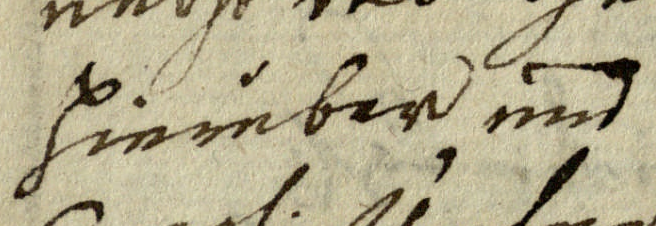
hierüber und
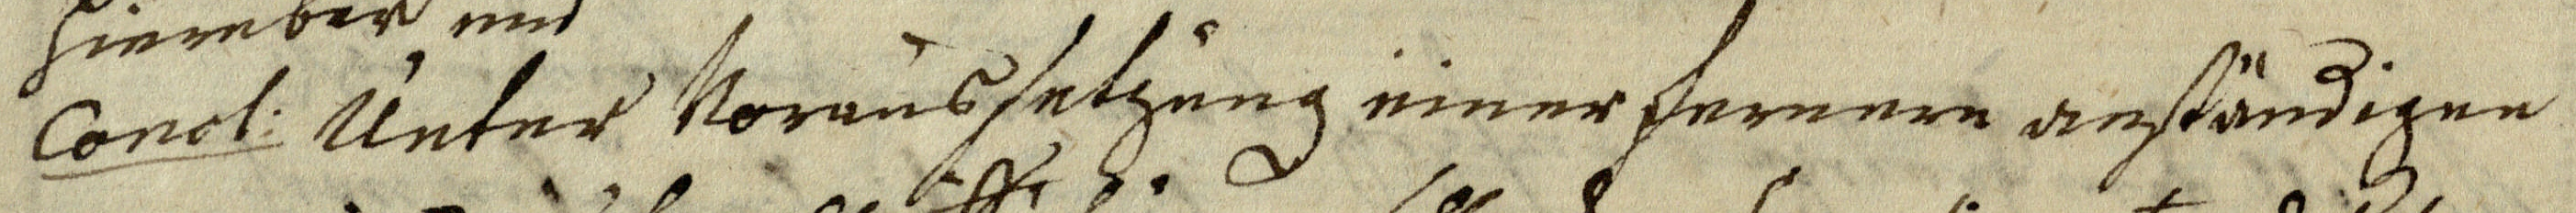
Concl. Unter Voraussetzung einer fernern anständigen
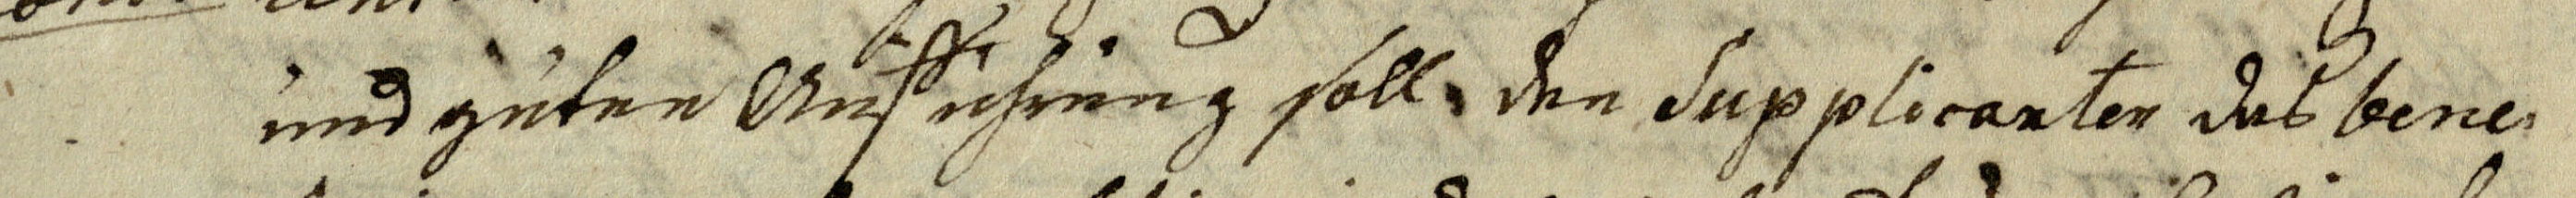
und guten Außuhrung soll den Supplicanten das bene¬
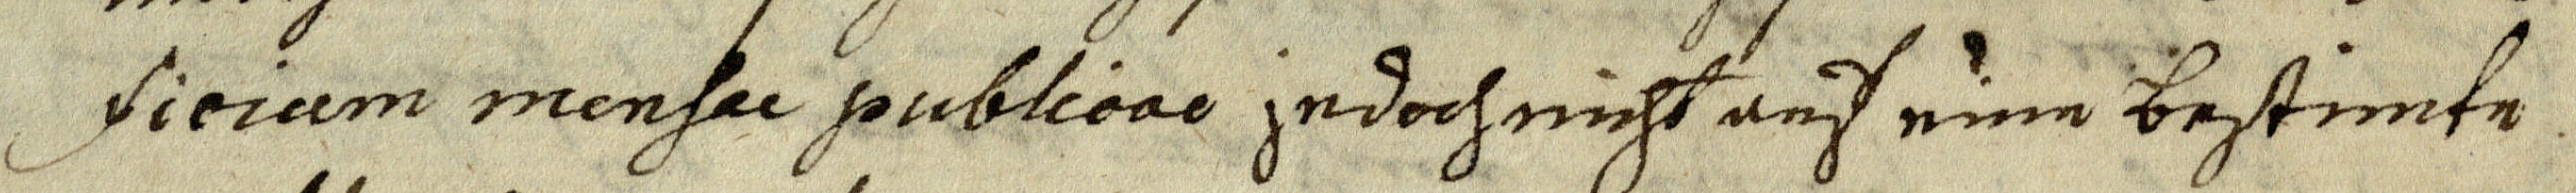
ficium mensae publicae jedoch nicht auf eine bestimte
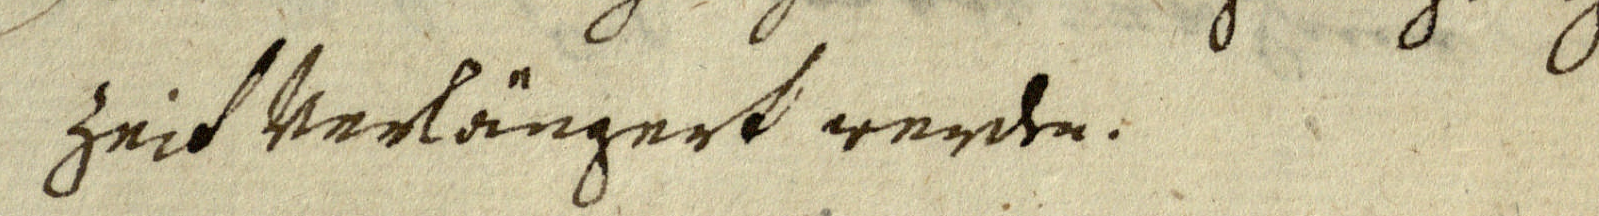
Zeit verlängert werden.
